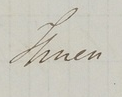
Ihnen
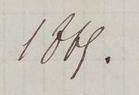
1869.
